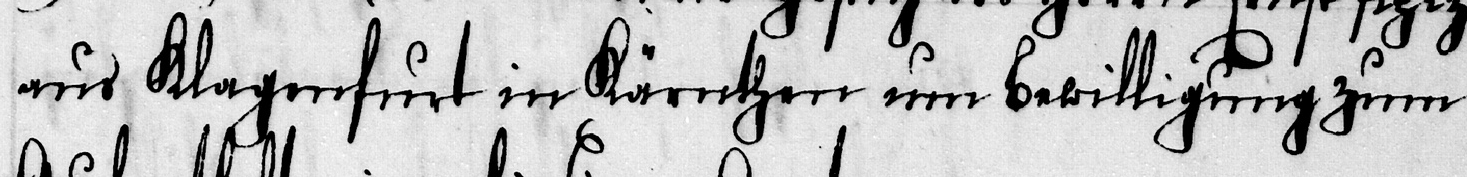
aus Klagenfurt in Kärnthen um Bewilligung zum
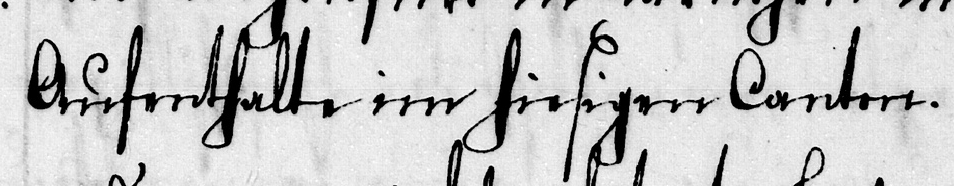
Aufenthalte im hiesigen Canton.
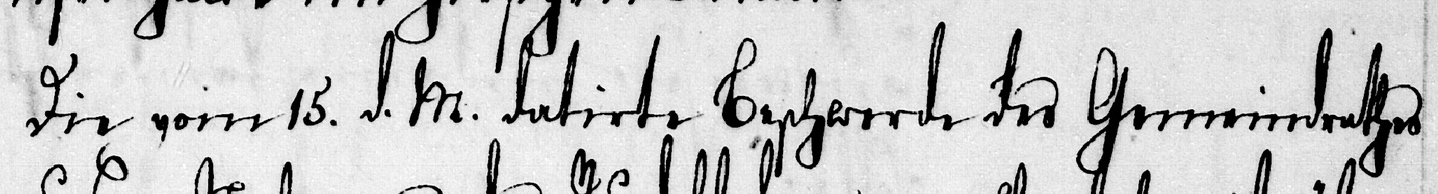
Die vom 15. d. M. datirte Beschwerde des Gemeindrathes
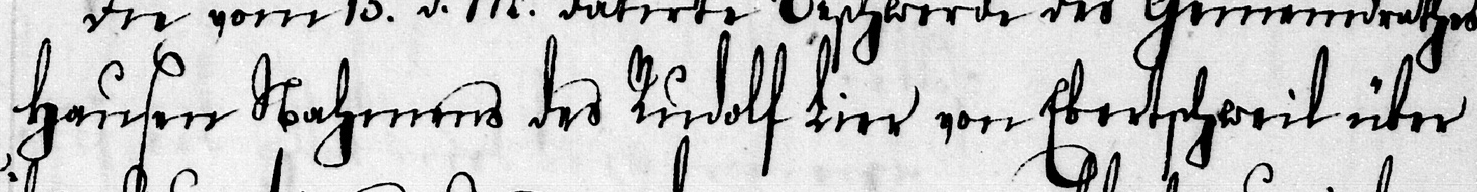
Hausen Nahmens des Rudolf Lier von Ebertschweil über
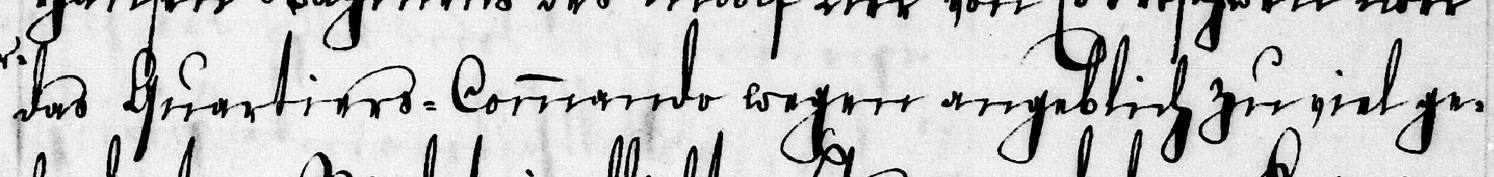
das Quartiers-Commando wegen angeblich zu viel ge¬
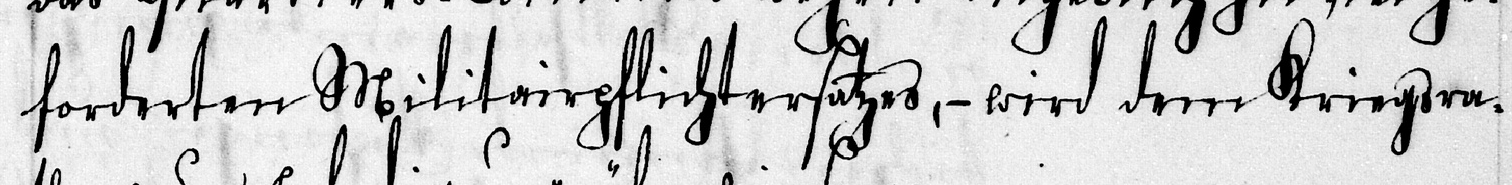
forderten Militairpflichtersatzes, – wird dem Kriegsra¬
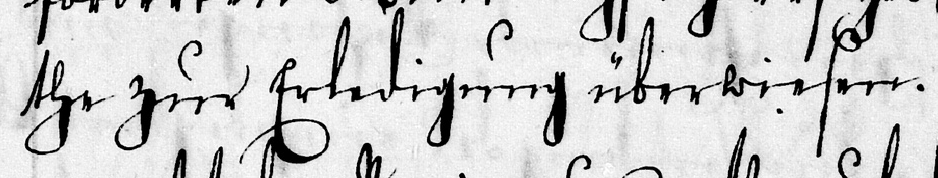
the zur Erledigung überwiesen.
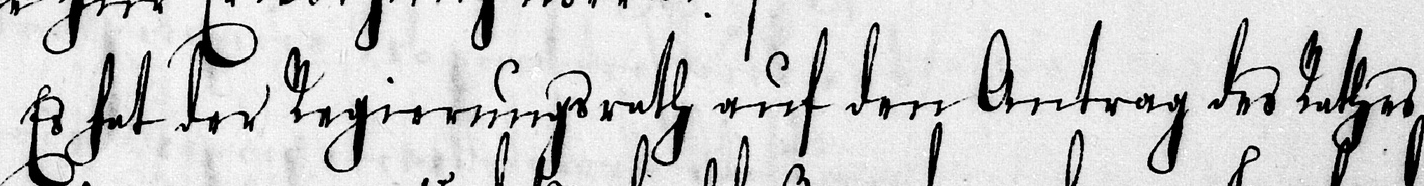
Es hat der Regierungsrath auf den Antrag des Rathes
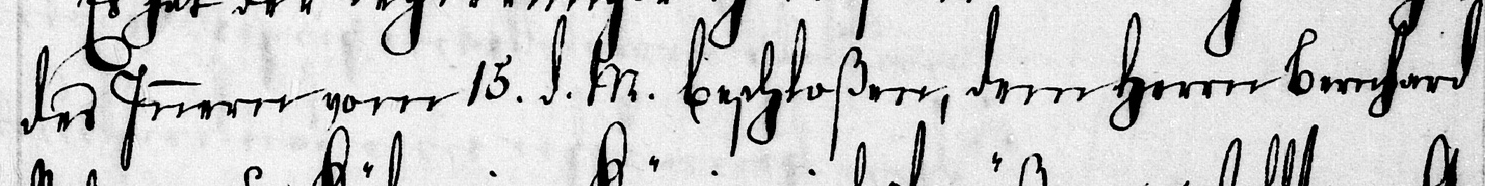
des Innern vom 15. d. M. beschloßen, dem Herrn Bernhard
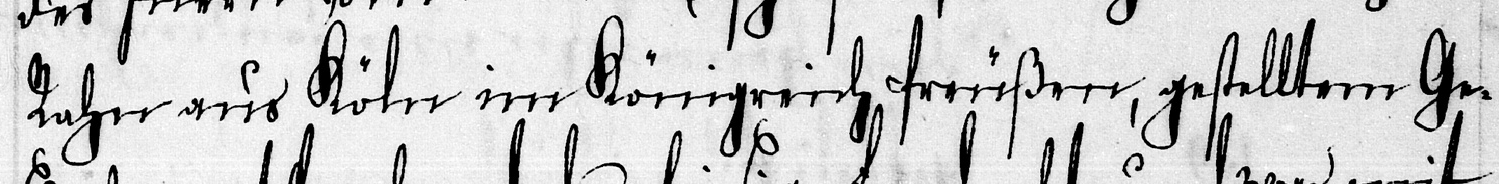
Rahn aus Köln im Königreich Preußen, gestelltem Ge¬
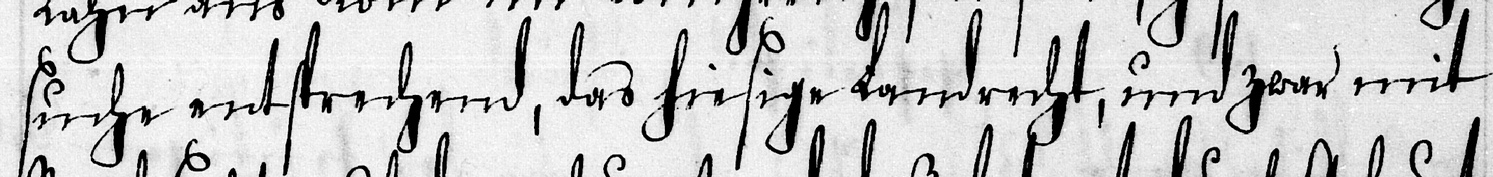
suche entsprechend, das hiesige Landrecht, und zwar mit
